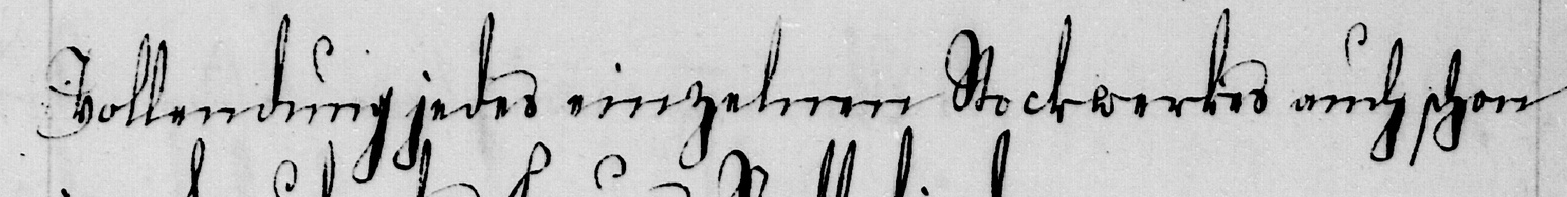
Vollendung jedes einzelnen Stockwerkes auch schon
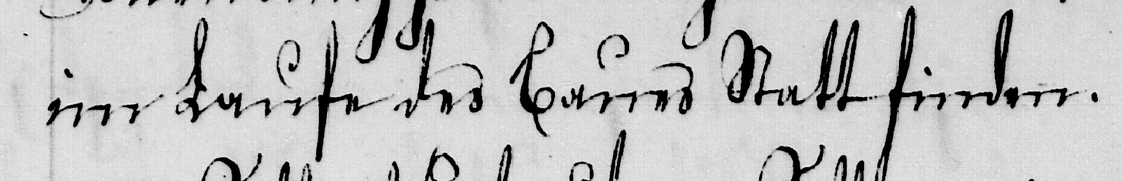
im Laufe des Baues Statt finden.
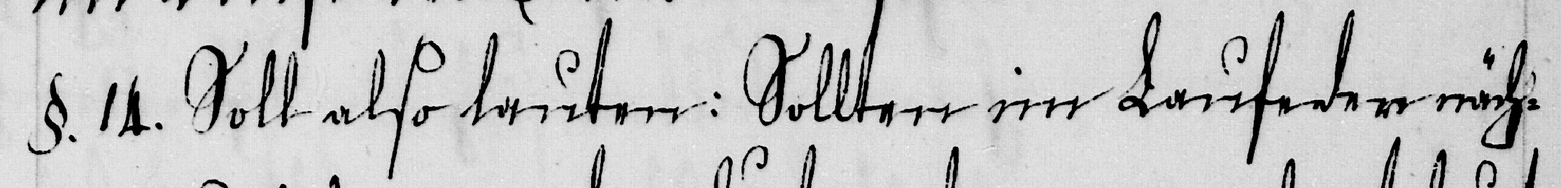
§. 14. Soll also lauten: Sollten im Laufe der näch¬
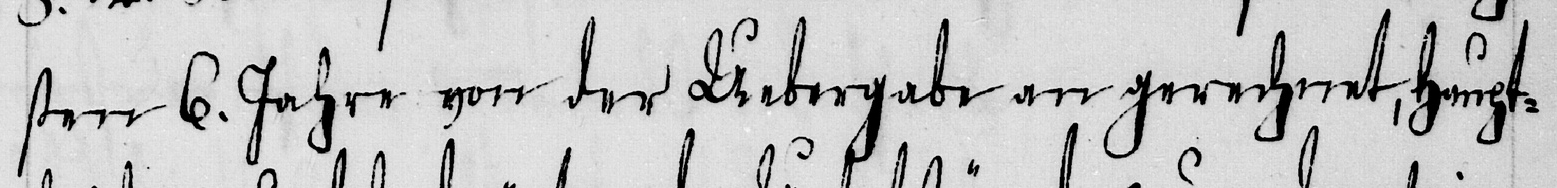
sten 6. Jahre von der Uebergabe an gerechnet, Haupt¬
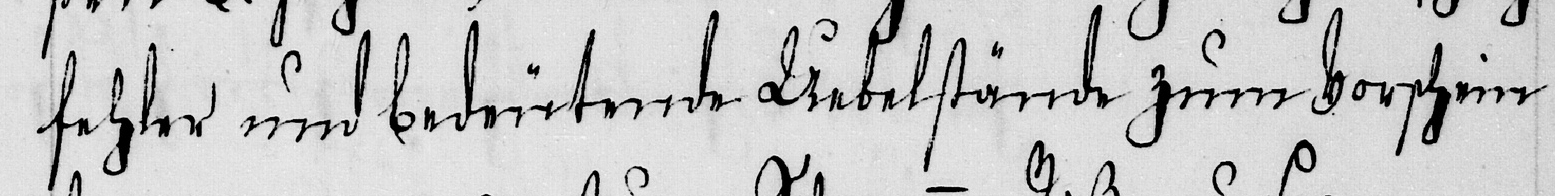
fehler und bedeutende Uebelstände zum Vorschein
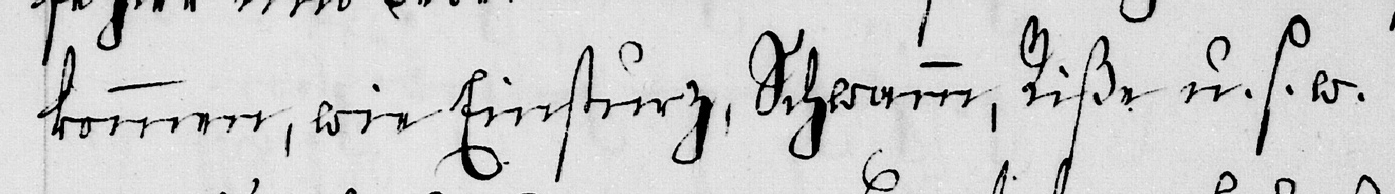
kommen, wie Einsturz, Schwamm, Riße u. s. w.
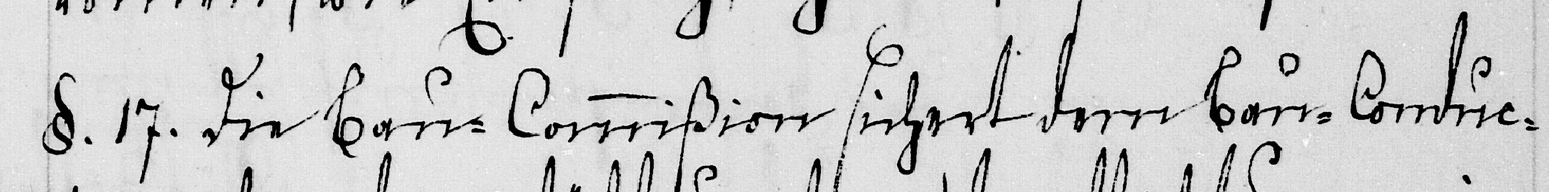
§. 17. Die Bau-Commißion sichert dem Bau-Conduc¬
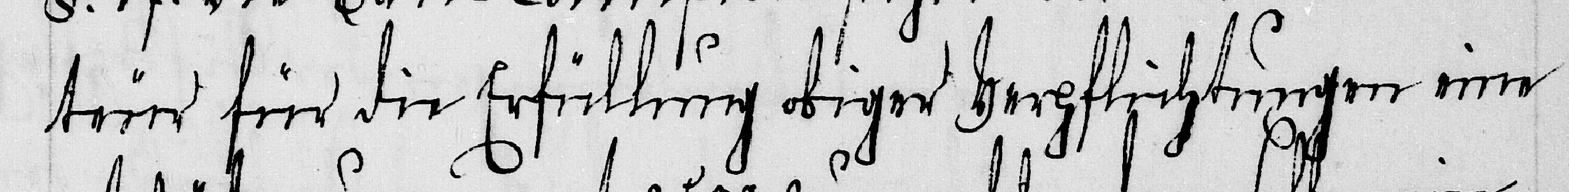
teur für die Erfüllung obiger Verpflichtungen eine
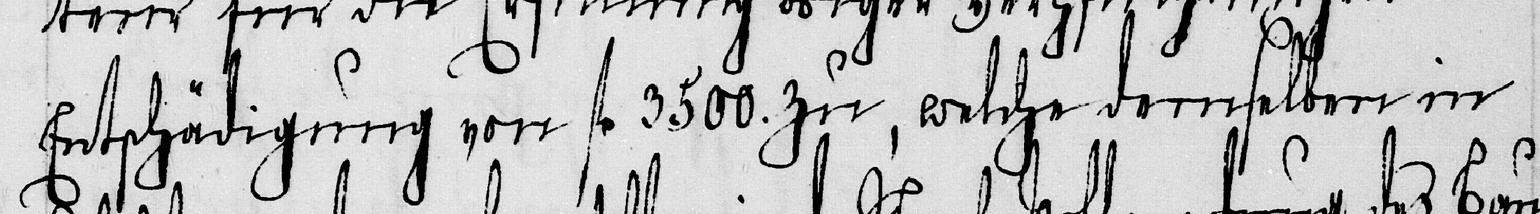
Entschädigung von fl. 3500. zu, welche demselben in
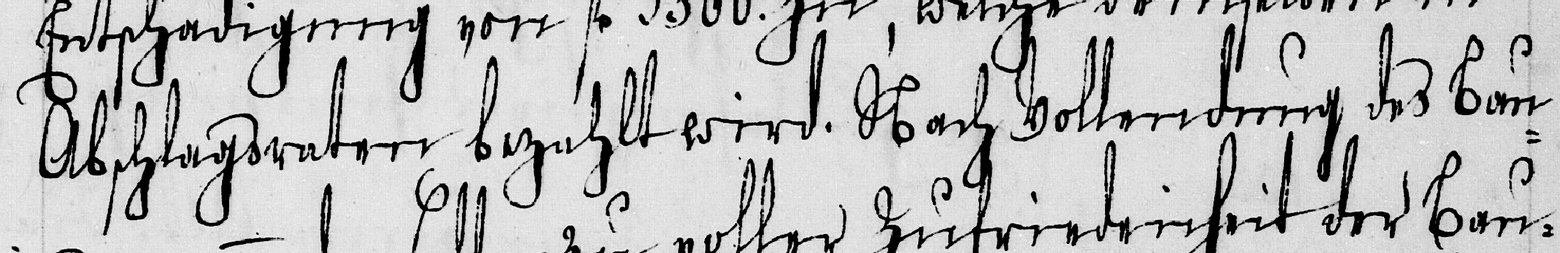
Abschlagsraten bezahlt wird. Nach Vollendung des Bau¬
